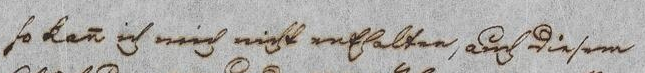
so kann ich mich nicht enthalten, auch diesem
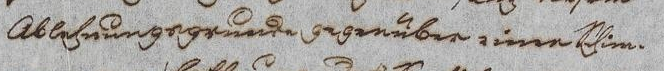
Ablehnungsgrunde gegenüber einen Schim-
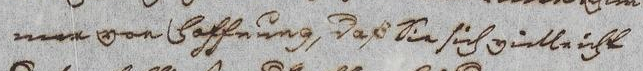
mer von Hoffnung, daß Sie sich vielleicht
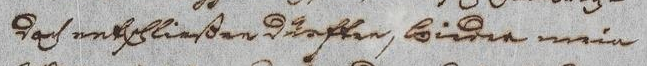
doch entschließen dürften, wieder mein
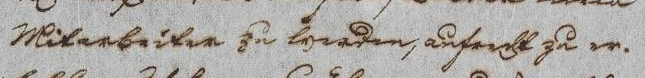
Mitarbeiter zu werden, aufrecht zu er-
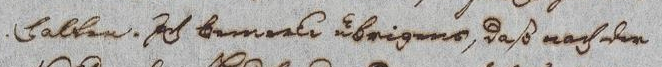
halten. Ich bemerke übrigens, daß nach der
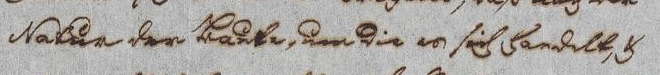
Natur der Baute, um die es sich handelt, &
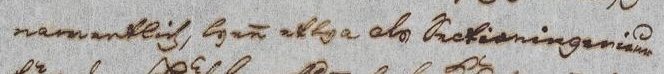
namentlich, wenn etwa als Sectionsingenieur
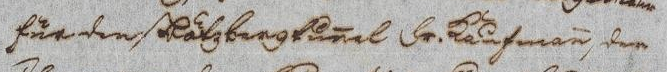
für den Bötzbergtunnel Hr. Kaufmann, der
